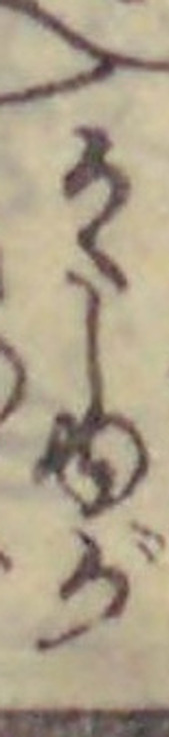かゝしゆが
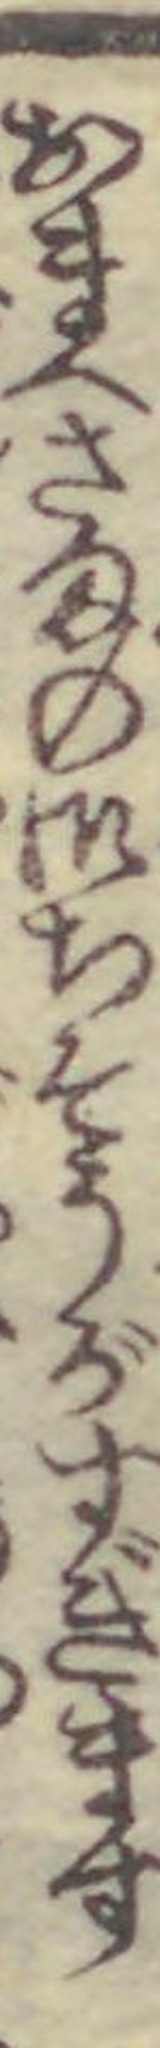おまへさまの御ちそうがすぎます
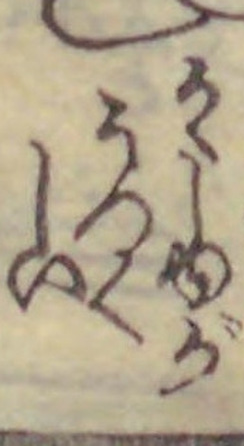うつく
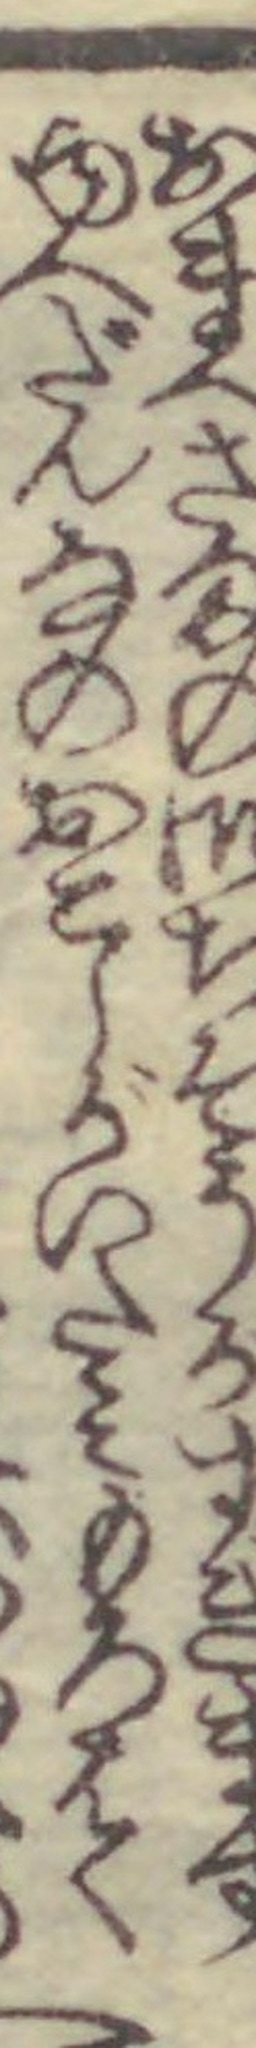ゆへだんなのおこしがいたみもろはく
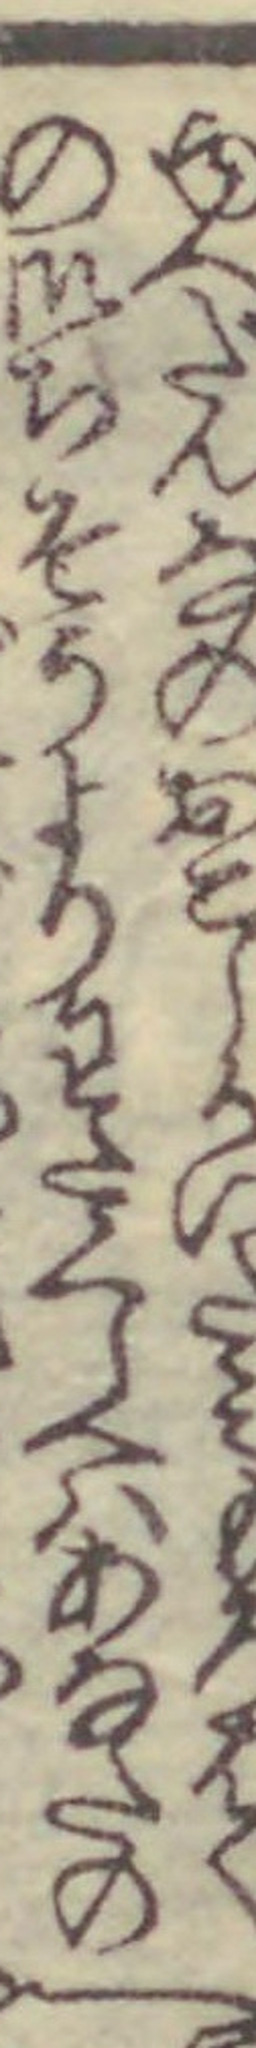の御ちそうよりわたくしへはあなたの
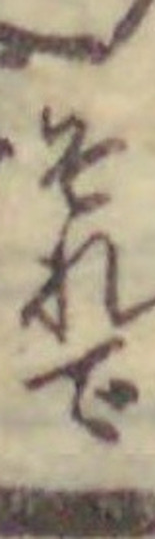それで
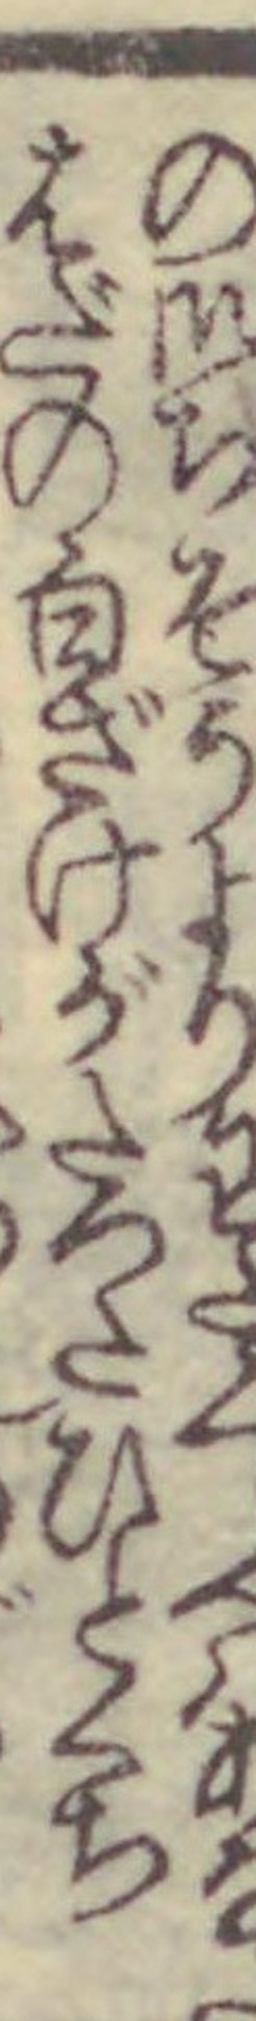はだの白ざけがたつたひとくち
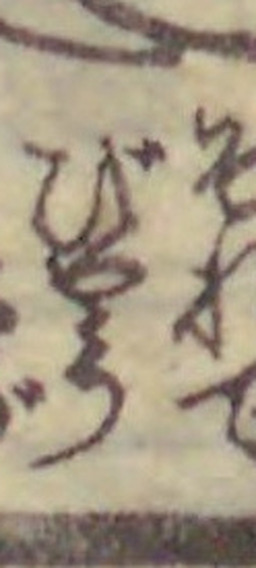びやう
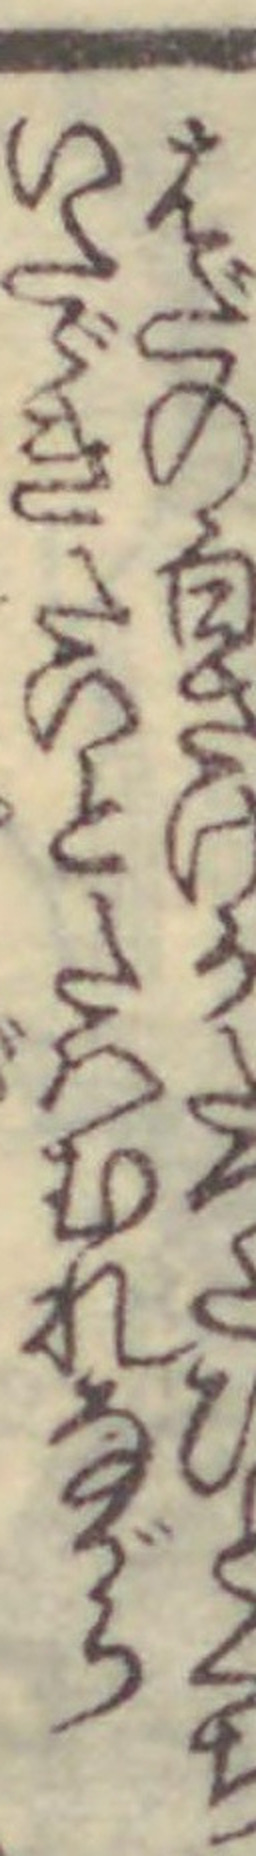いたゞきたいとたはむれながら
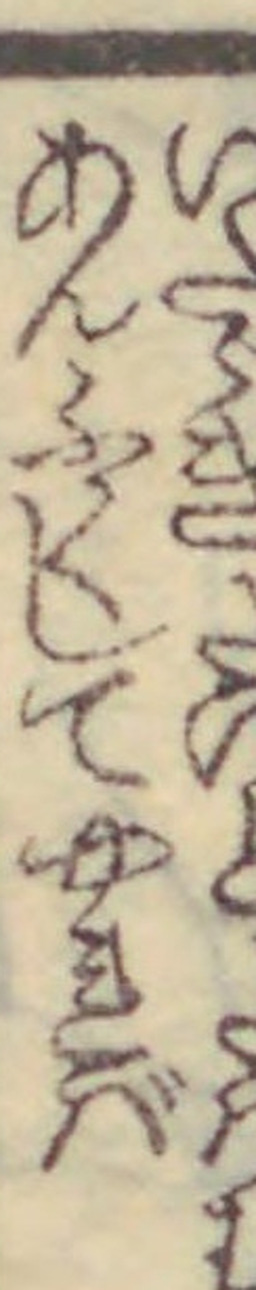あんふくしてやれば
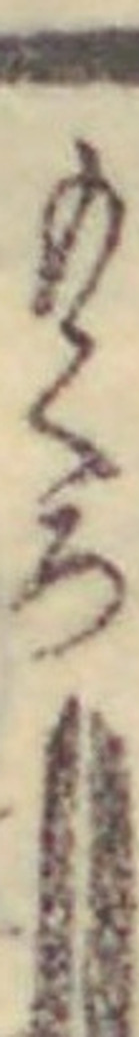もくろ
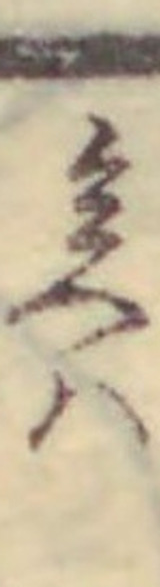兵へは
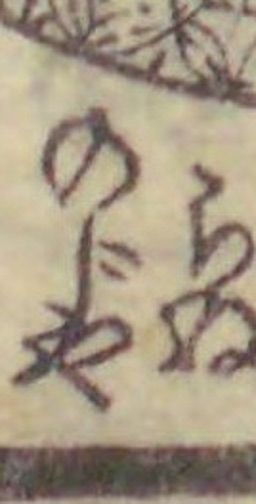のじや
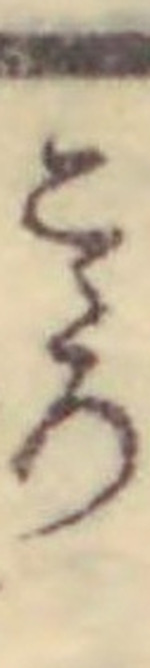こゝろ
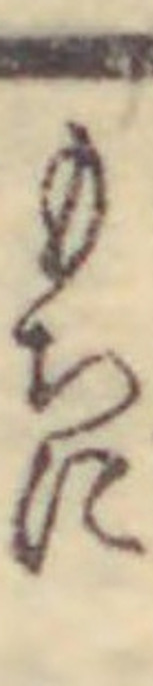もちに
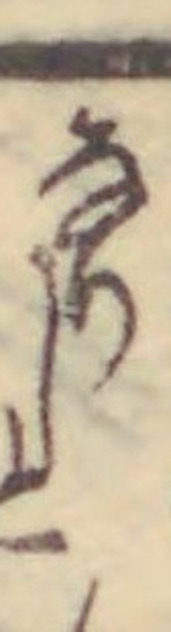なりしと
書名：腹内窺機関 2巻
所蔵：国立国会図書館 National Diet Library, JAPAN
